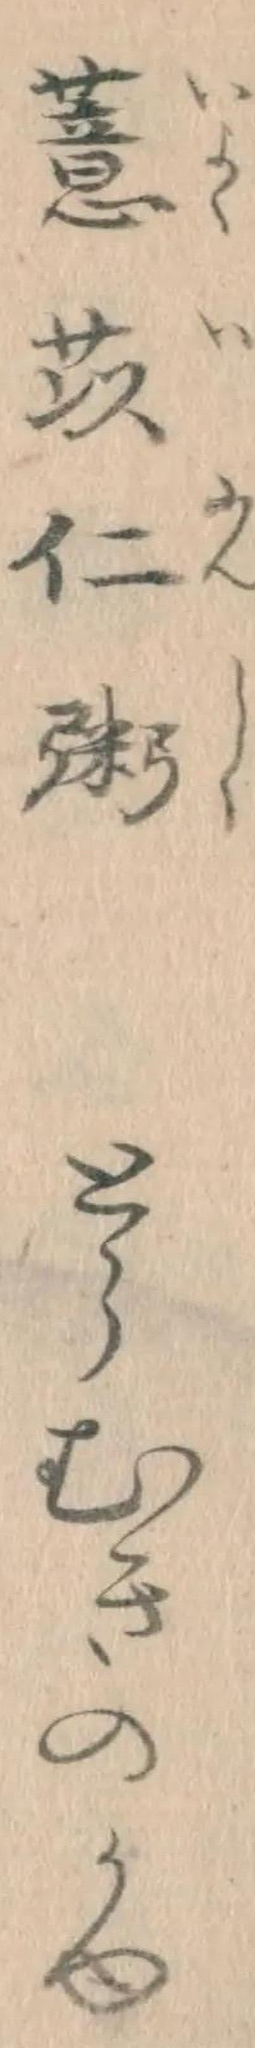薏苡仁粥とうむきのかゆ
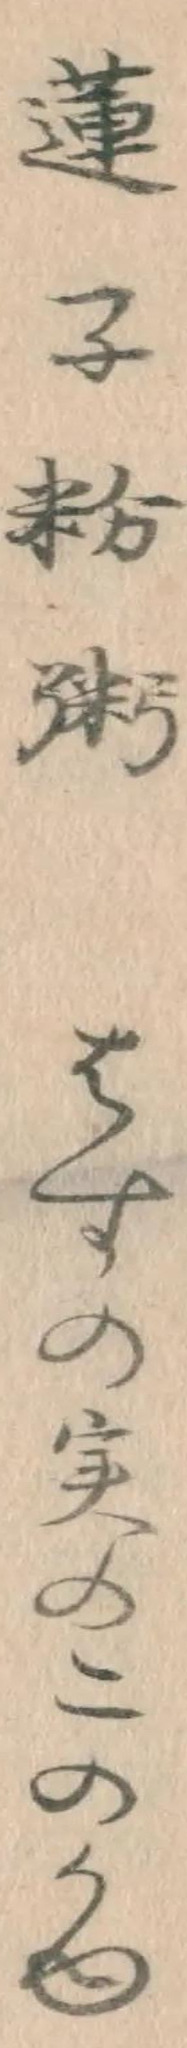蓮子粉粥はすの実のこのかゆ
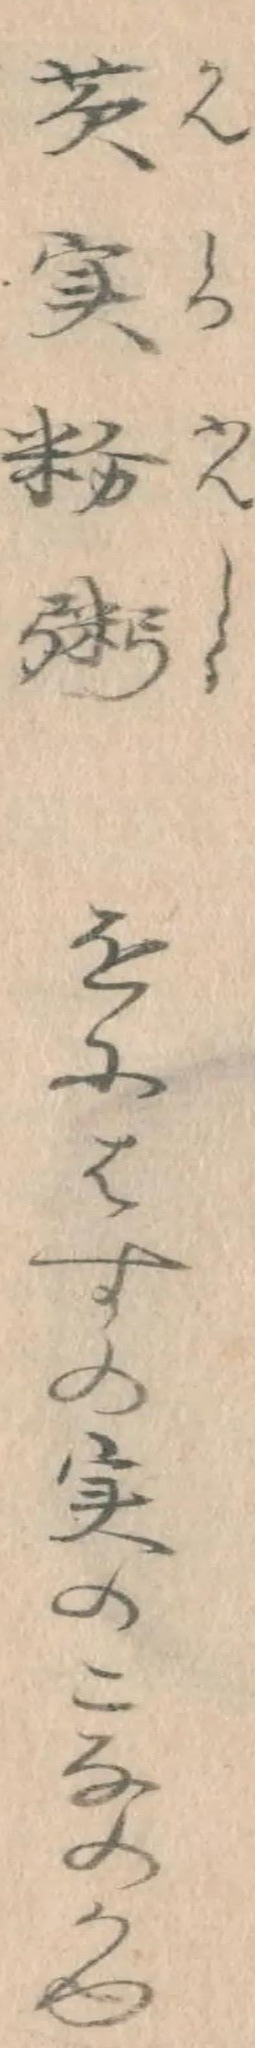芡実粉粥をにはすの実のこなのかゆ
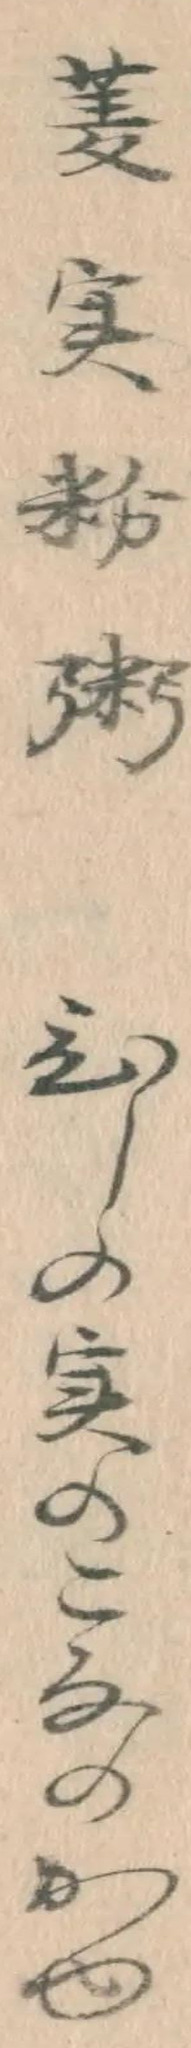芡実粉粥をにはすの実のこなのかゆ
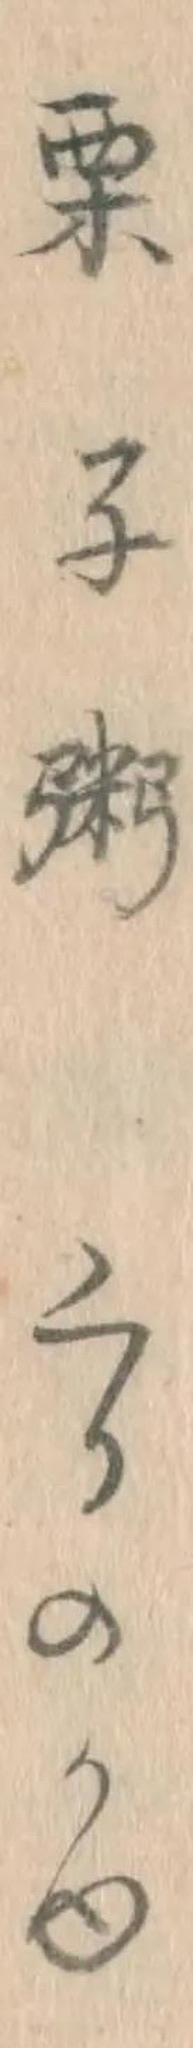栗子粥くりのかゆ
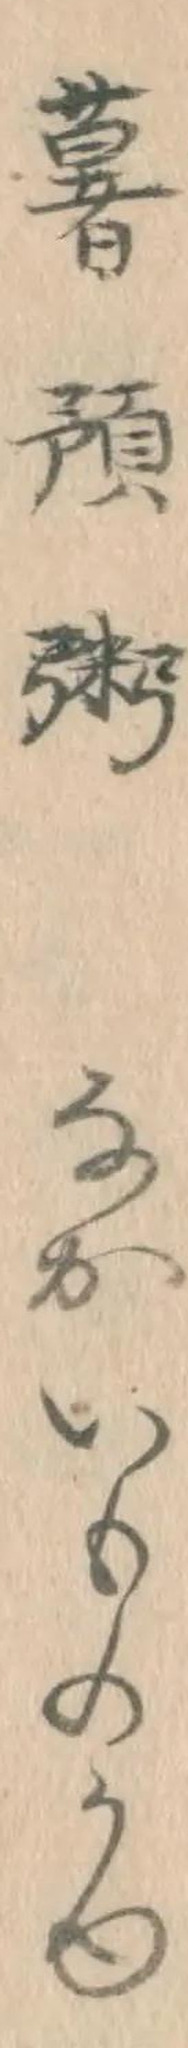薯預粥なかいものかゆ

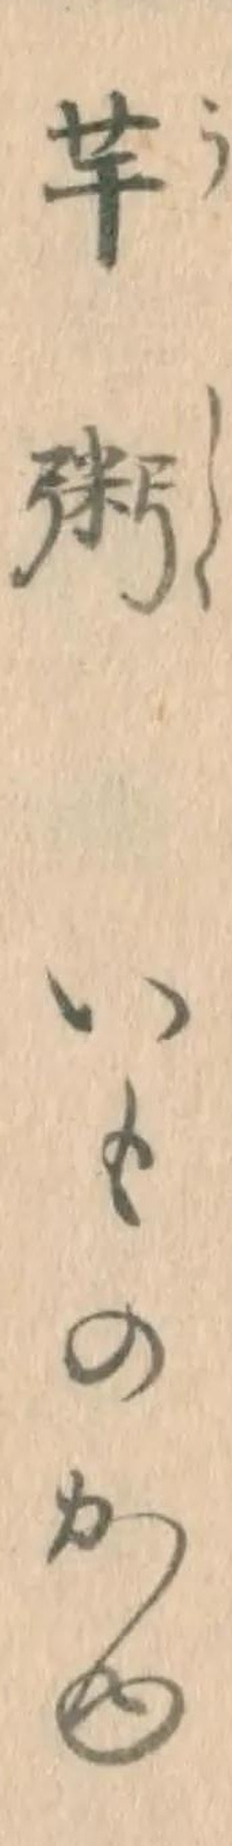芋粥いものかゆ
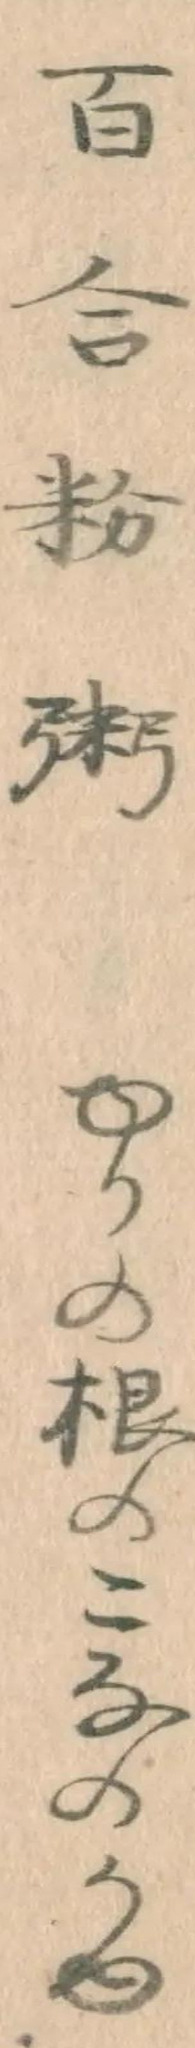百合粉粥ゆりの根のこなのかゆ
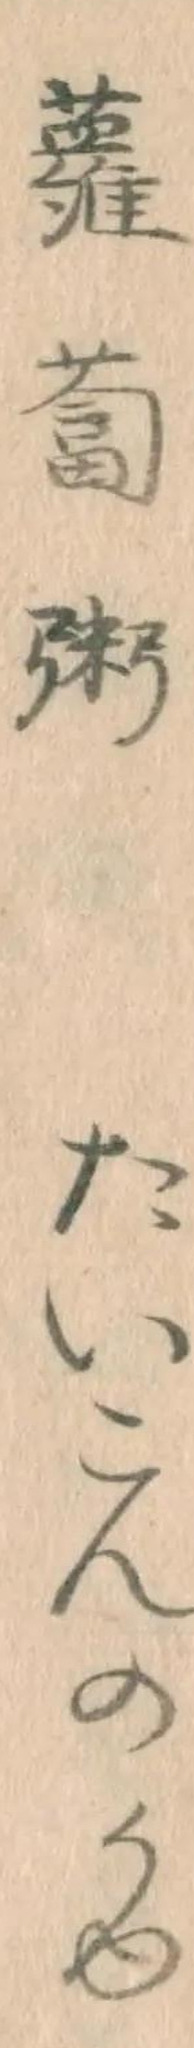蘿蔔粥たいこんのかゆ
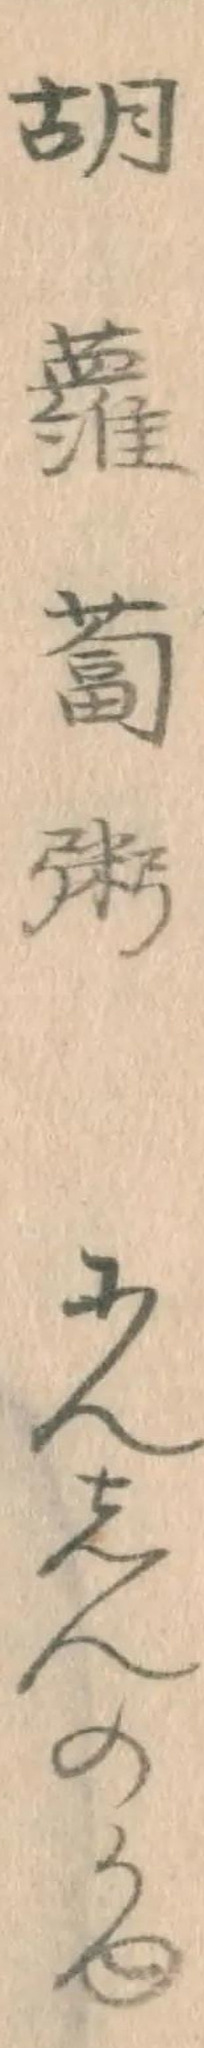胡蘿蔔粥にんしんのかゆ
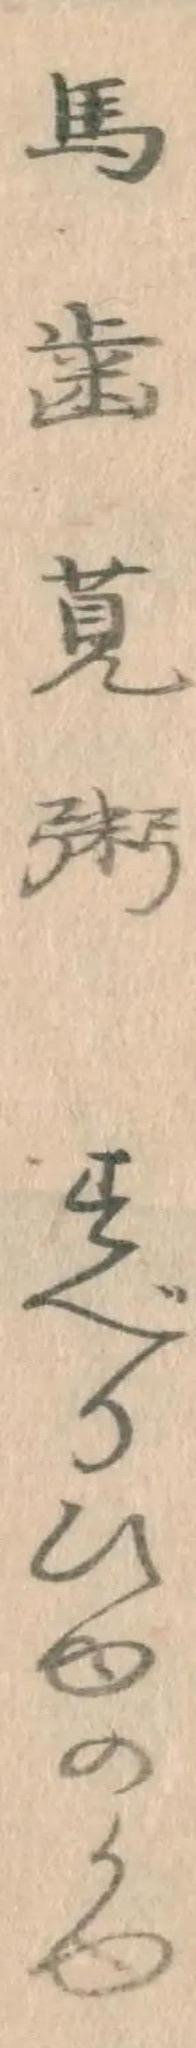馬歯莧粥すべりひゆのかゆ
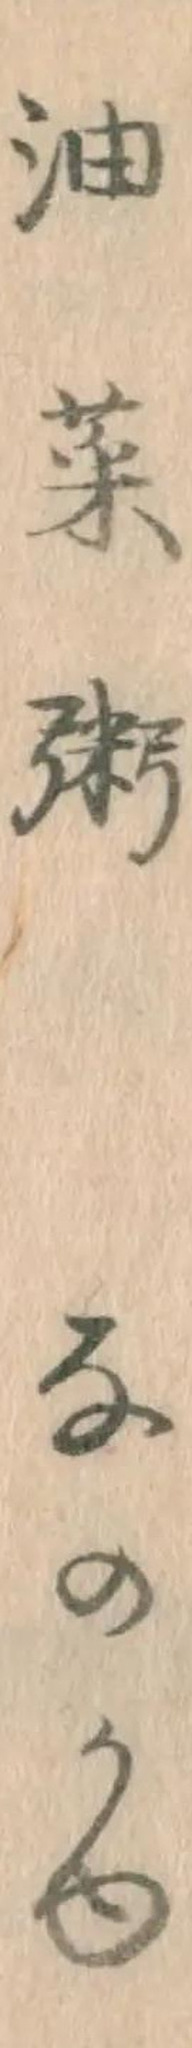油菜粥なのかゆ
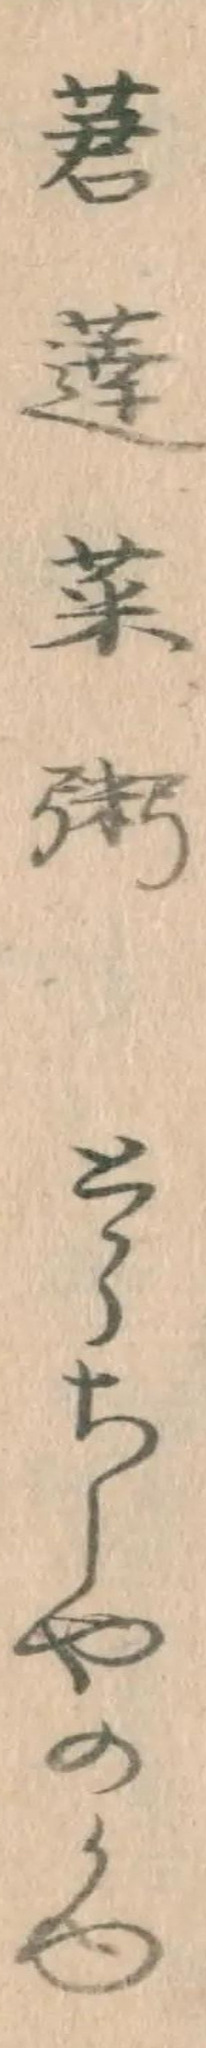莙薘菜粥とうちしやのかゆ
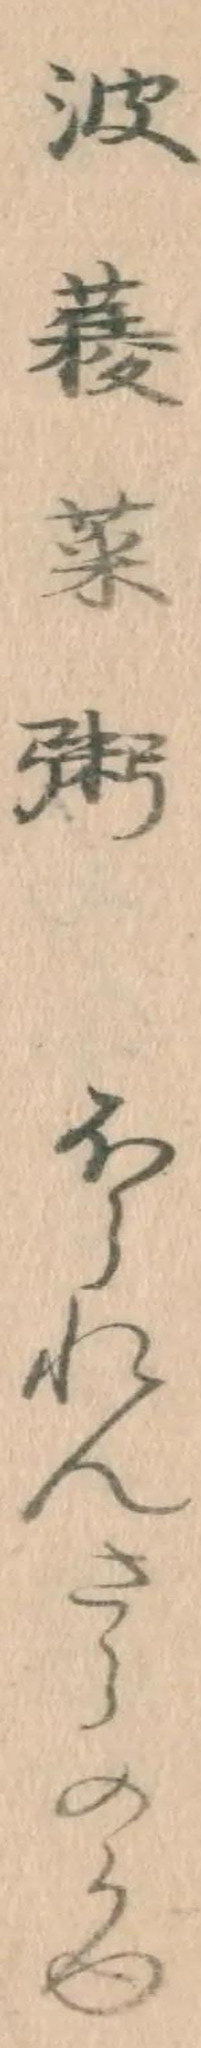波薐菜粥ほうれんさうのかゆ
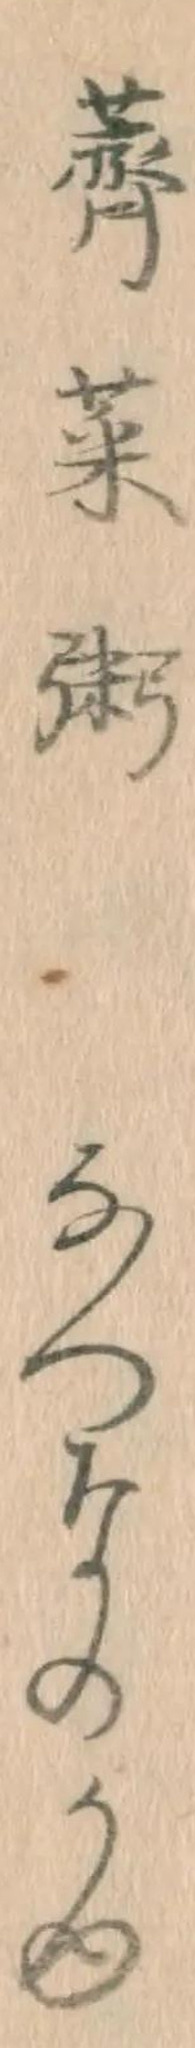薺菜粥なつなのかゆ
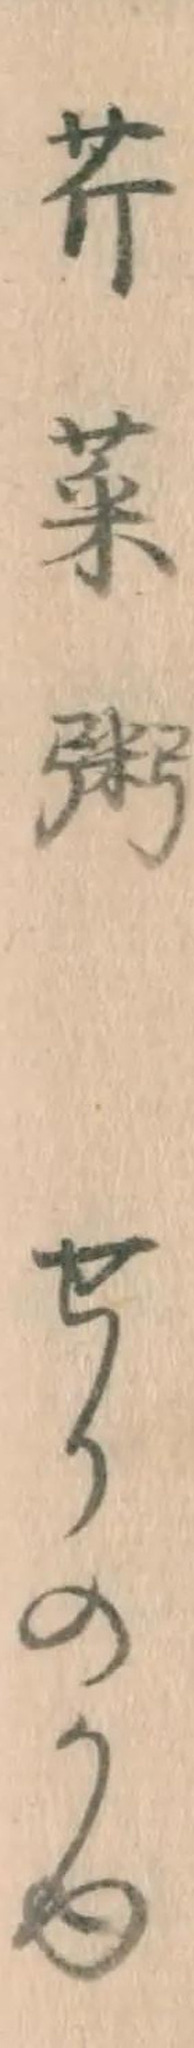芹菜粥せりのかゆ
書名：本草図譜. 巻43-45
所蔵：国立国会図書館 National Diet Library, JAPAN
